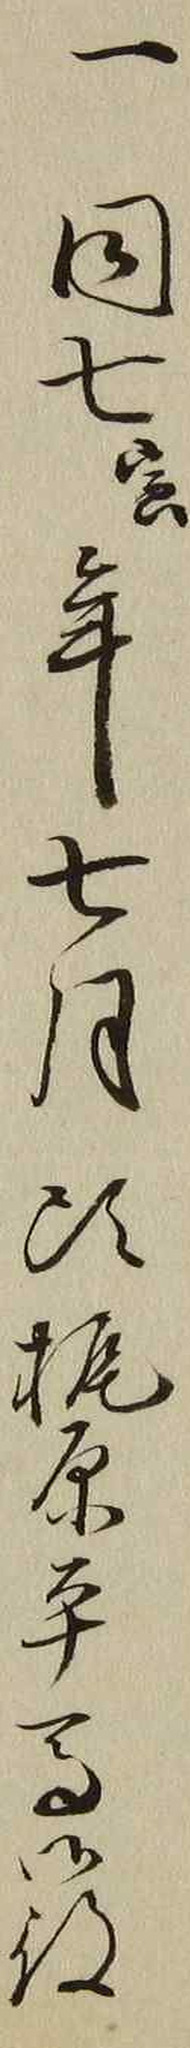一同七寅年七月梶原平馬御役
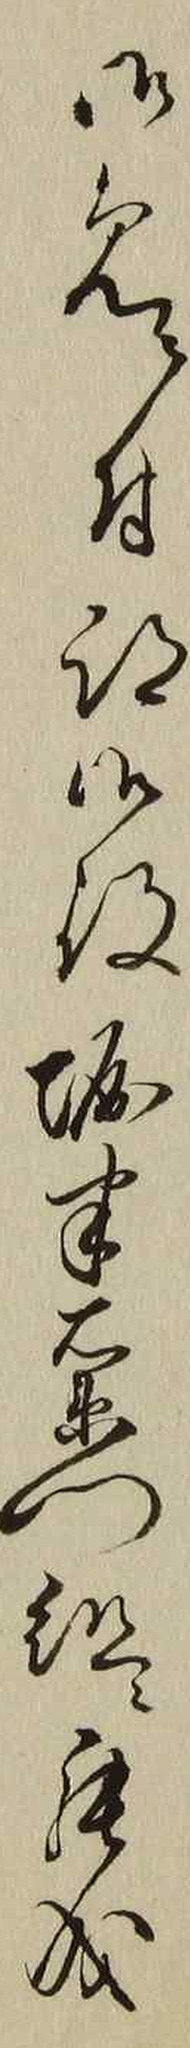御免に付跡御役堀半右衛門組に罷成
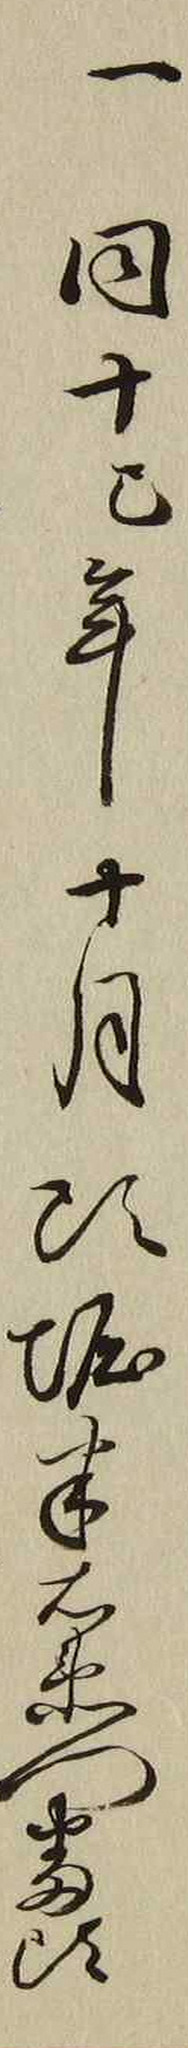一同十巳年十月頭堀半右衛門番頭
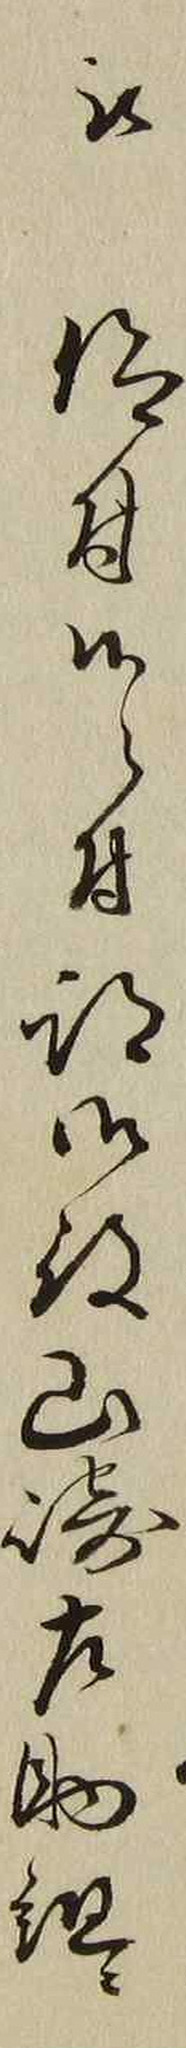被仰付候に付跡御役山崎左助組に
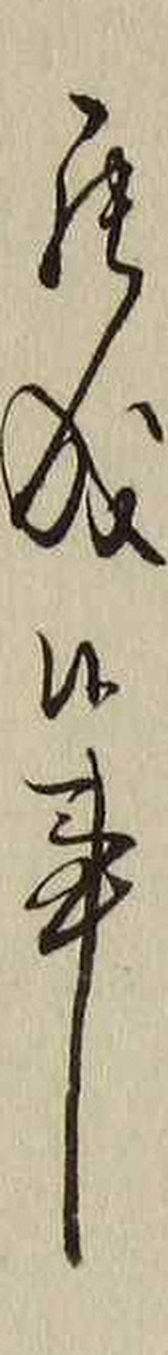罷成候事
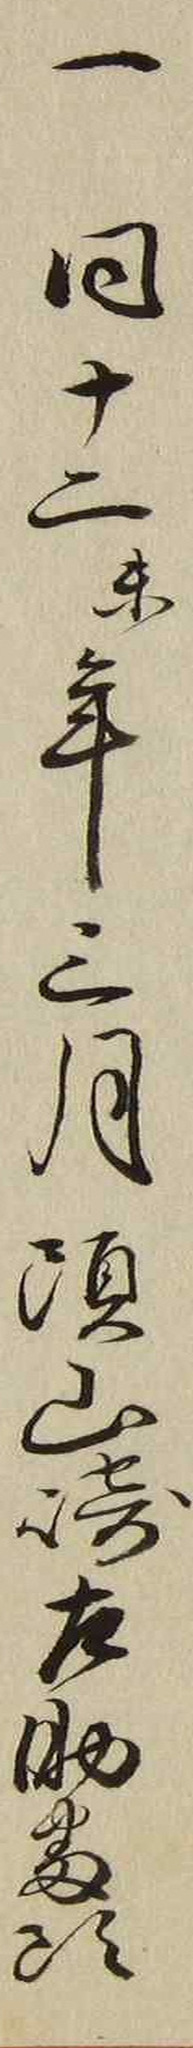一同十二未年三月頭山崎左助番頭
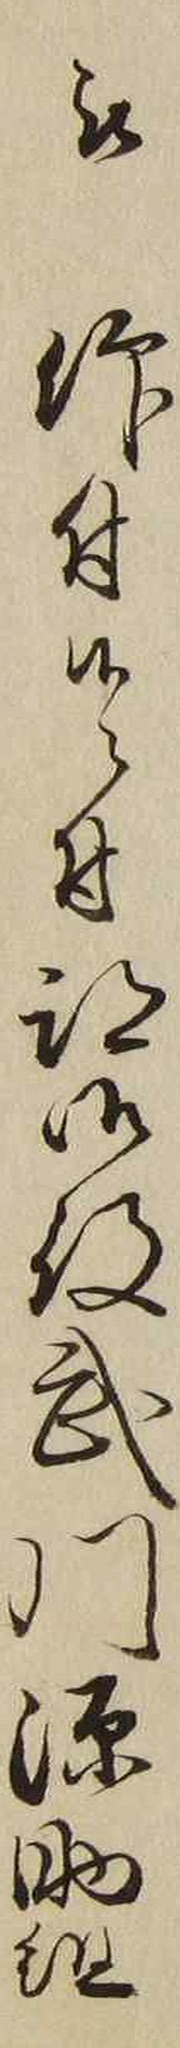被仰付候に付跡御役武川源助組

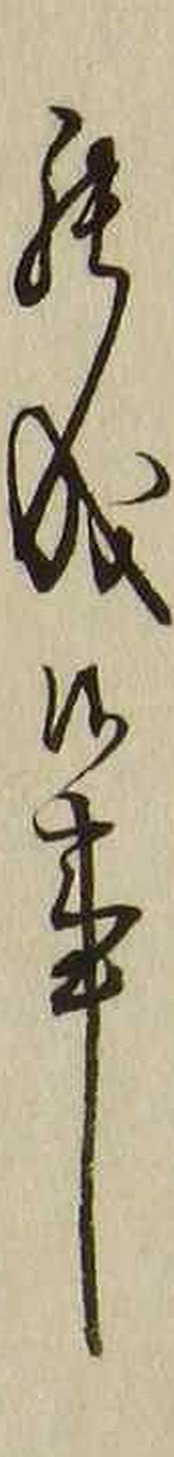罷成候事
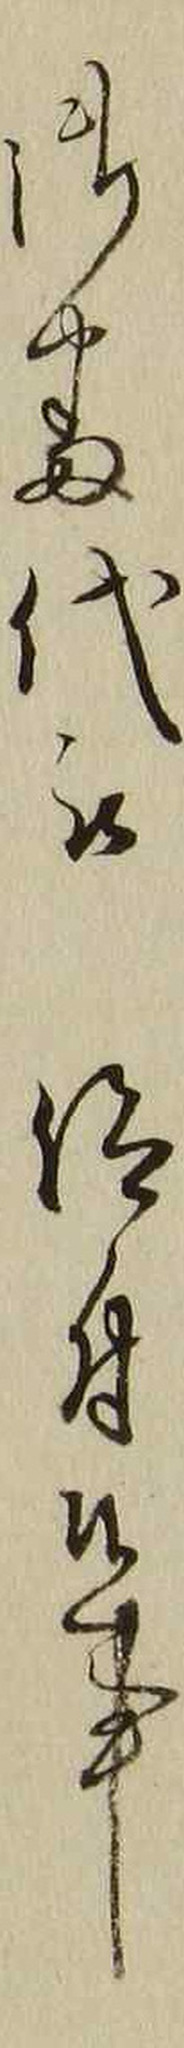御番代被仰付候事
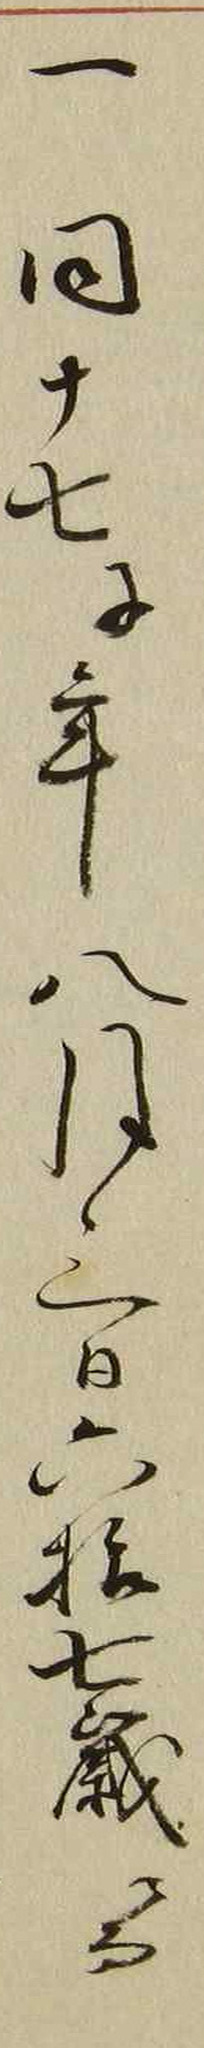一同十七子年八月三日六拾七歳に而
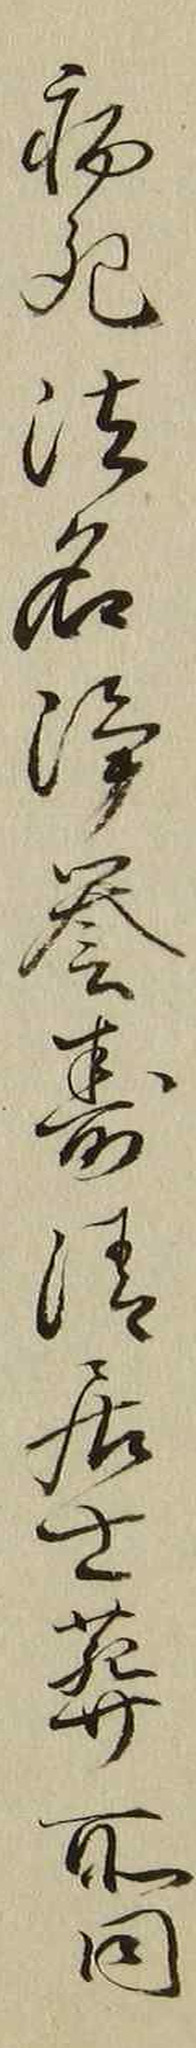病死法名浄誉寿清居士葬所同
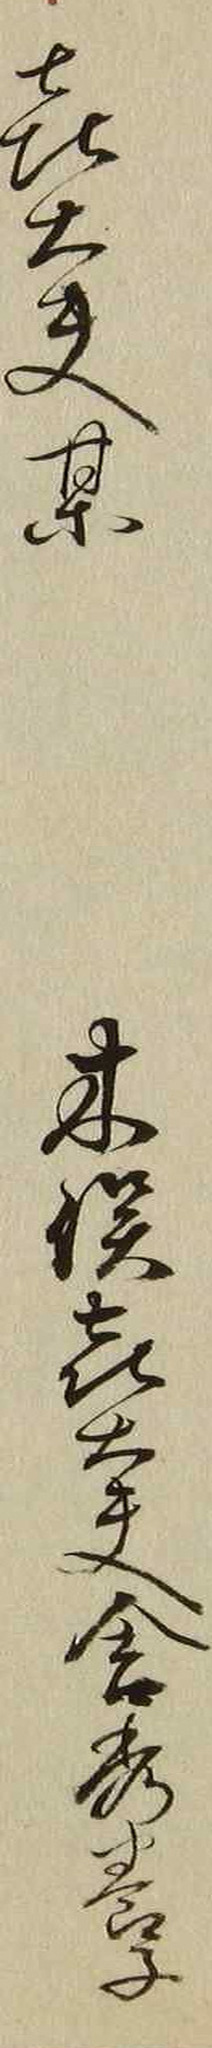喜太夫某木俣喜太夫舎秀養子
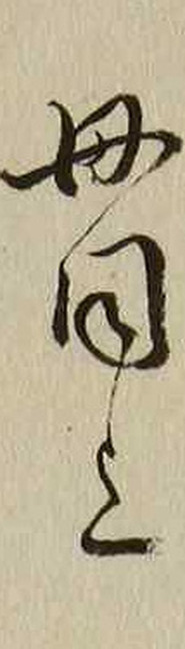母同上
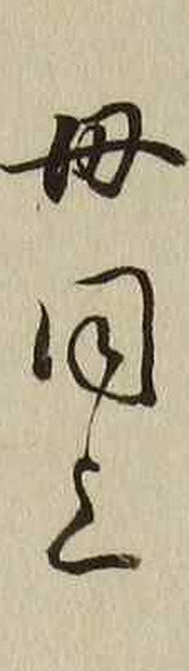母同上
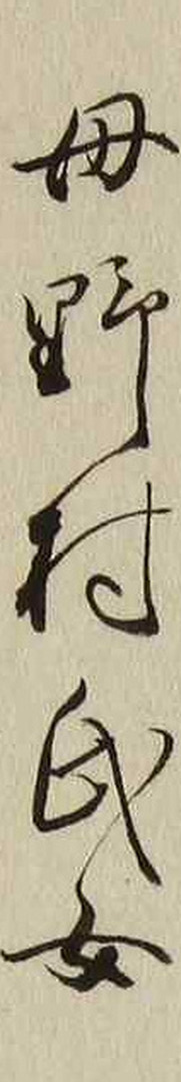母野村氏女

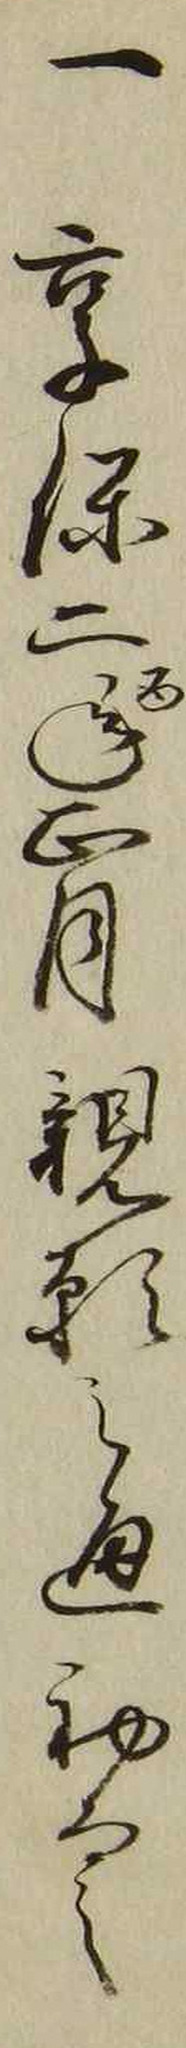一享保二酉年正月親願の通初而の
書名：諸士系譜　巻之1　い之部1
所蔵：会津若松市立会津図書館
